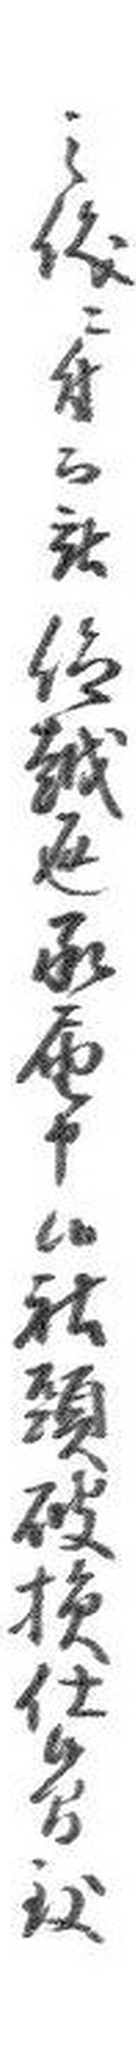之儀ニ付而被仰越通承届申候社頭破損仕候間致
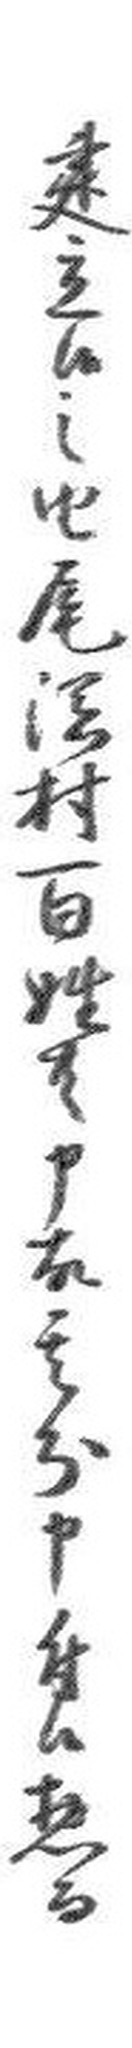建立候之由尾添村百姓共申故其分申付候惣而
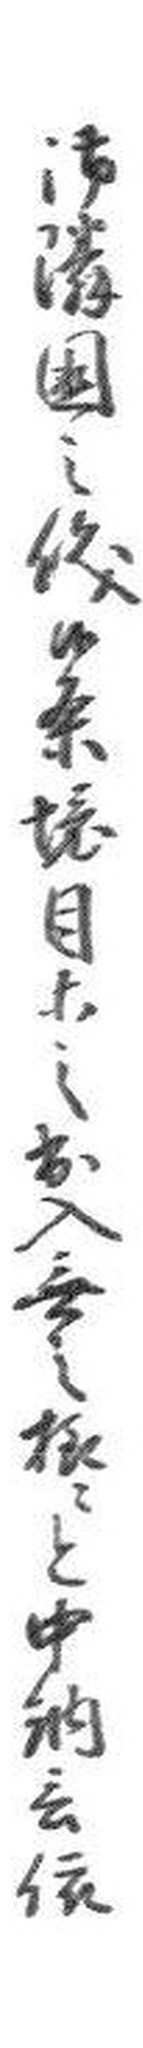御隣国之儀候条境目等之出入無之様ニと中納言頼依
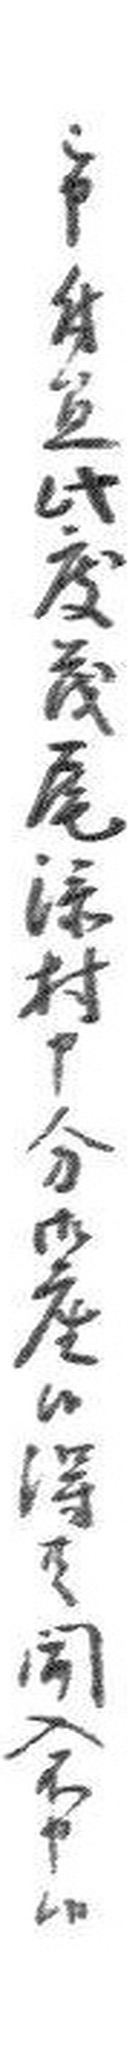被申付置此度茂御添村申分御座候得共聞入不申候
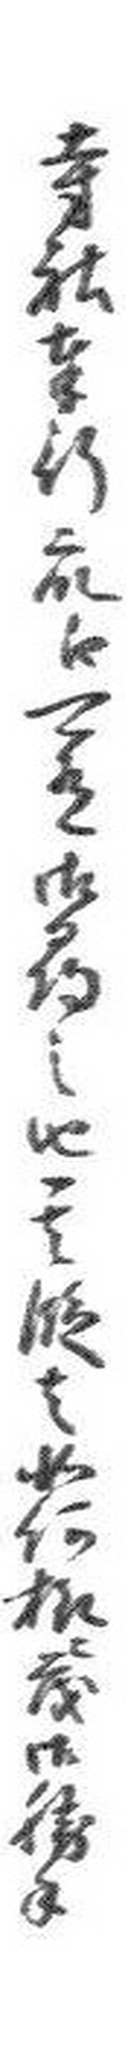寺社奉行衆江可有御尋之由其段者如何様ニ茂御勝手
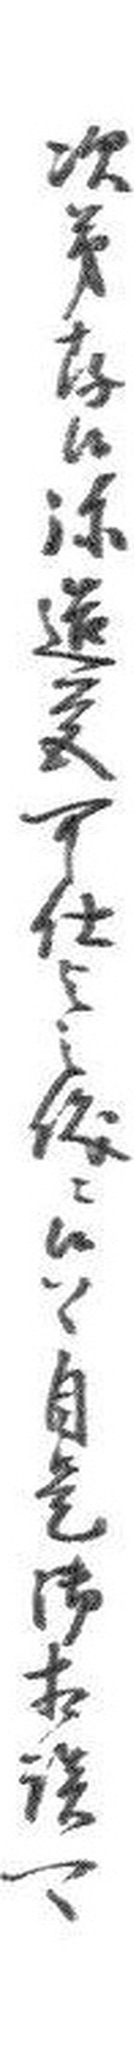次第存候弥造営可仕与之儀ニ候ハゝ自是御相談可
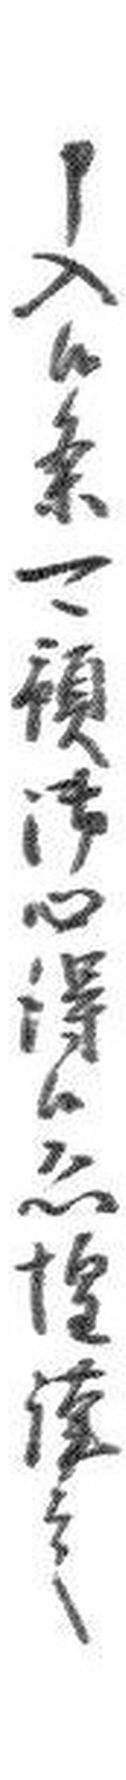申入候条可預御心得候恐惶謹言
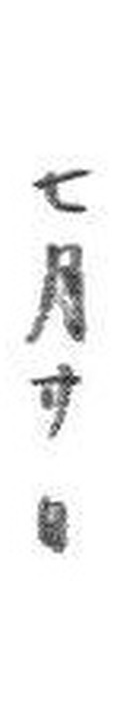七月三日

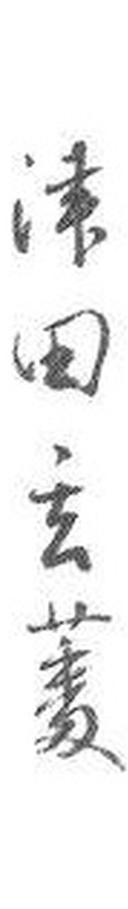津田玄蕃
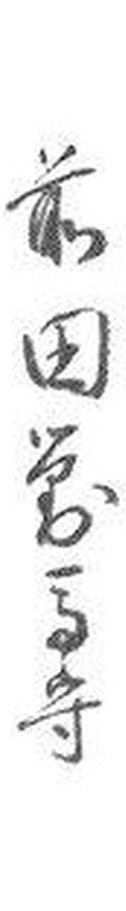前田対馬守
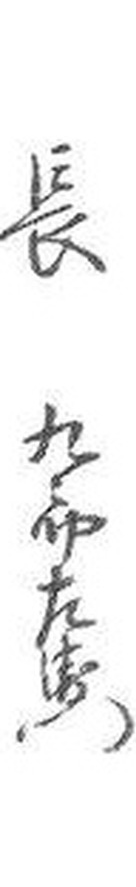長九郎左衛門
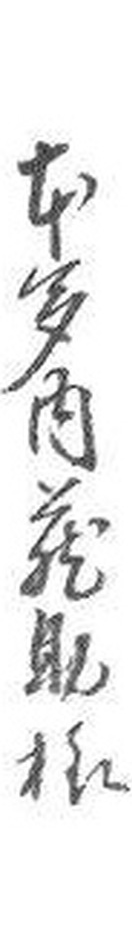本多内蔵助様
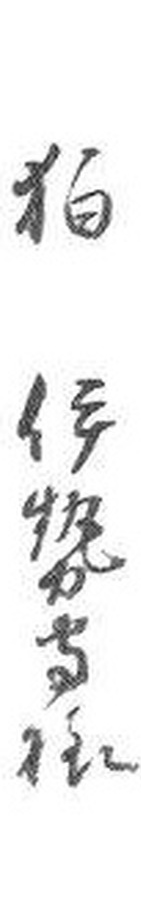狛伊勢守様
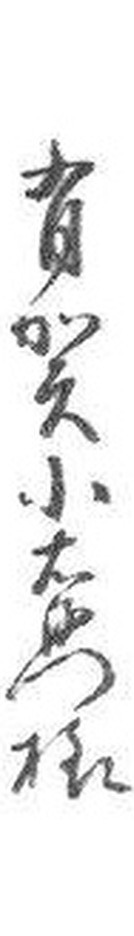有賀小右衛門様
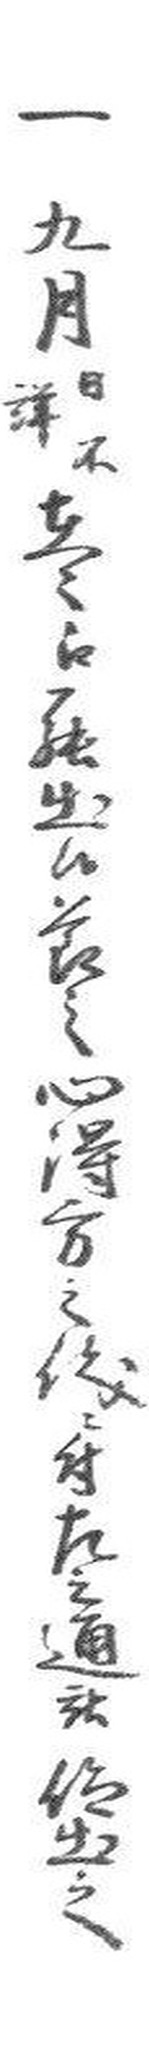一九月日不詳在々江罷出候節之心得方之儀ニ付左之通被仰出之
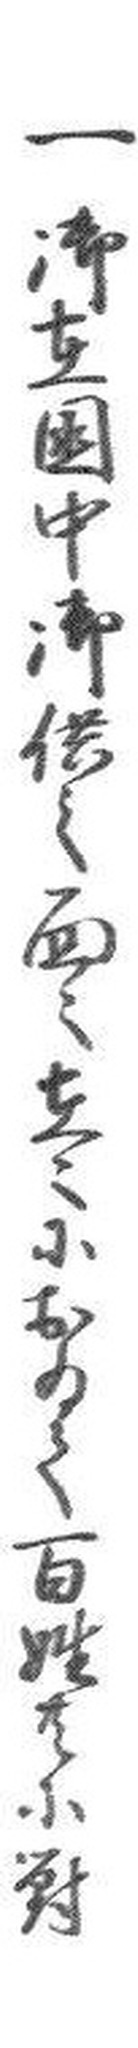一御在国中御供之面々在々におゐて百姓共に対
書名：家譜 五 光通公 従寛永十三年到万治二年
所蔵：福井県文書館 Fukui Prefectural Archives
